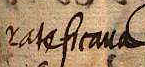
rateficaua
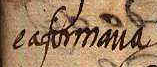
e afirmaua
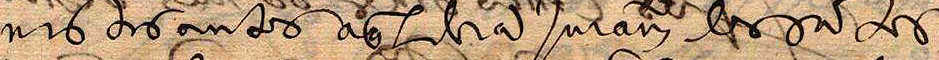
nestes autos a q̄l derā Juramto dos sātos
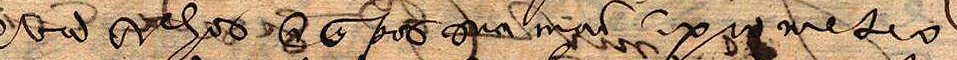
evāgelhos ē q̄ pos sua maõ e prometeo
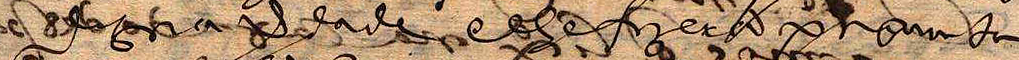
diser ꝟdade e lhe fizerā pregunta
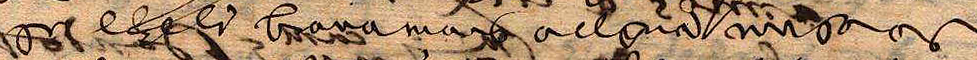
se lhe lēbraua mais allguā cousa asj
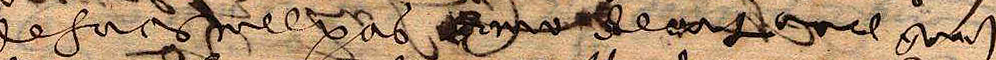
de suas cullpas como de outa allguā
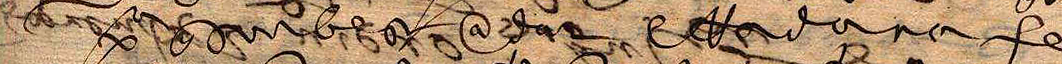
pa q̄ soubese ādar eRada na fee
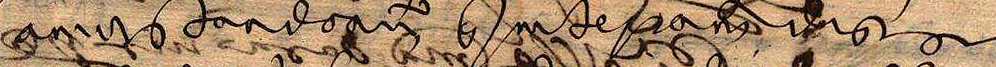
amoestandoa mto q̄ Jmtejramte disese
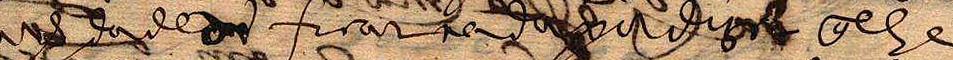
a ꝟdade sē ficar nada por diser q̄ lhe
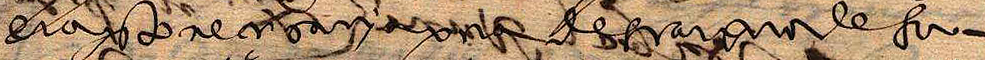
era ysto neçesaryo pera descarguo de sua
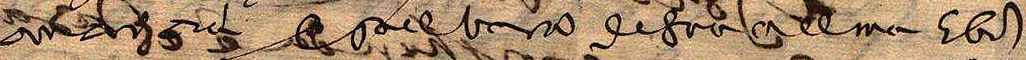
conciēsia e salvacā de sua allma E bō
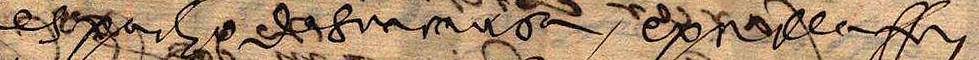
despacho de sua causa / e por ella ffoy
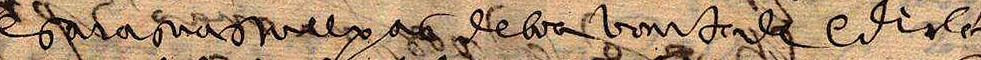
fesara suas cullpas de boa vomtade e decla
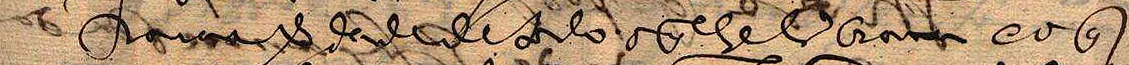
rara a ꝟdade de todo o q̄ lhe lēbraua e o q̄
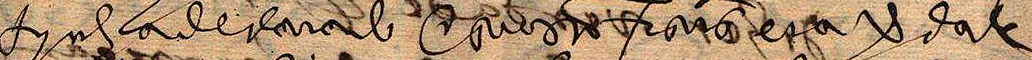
tjnha declarado ē suas cōfisoẽs era ꝟdade
